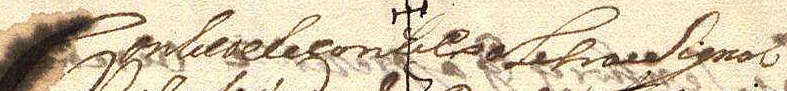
Conheço e Reconheço a Letra e signal
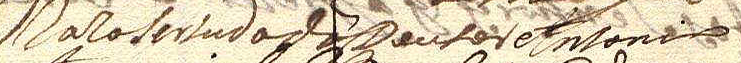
Raro ser tudo do Doutor Antonio
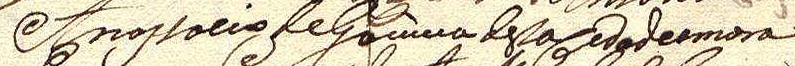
Anastacio de Gouuea desta Cidade e mora
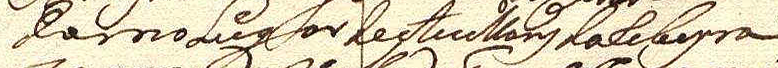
dor no Lugar de Auellans da Rebeyra
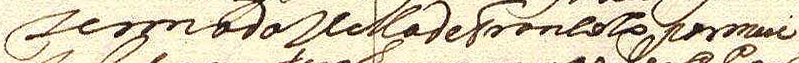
termo da Villa de Trancozo por mui
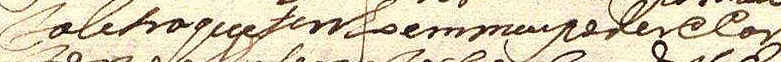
ta letra que tenho em meu poder e Car
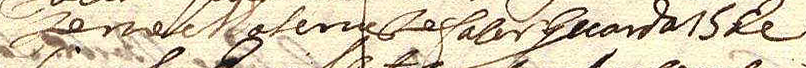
torio lho ter visto fazer Guarda 15 de
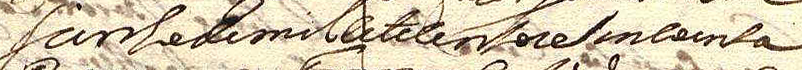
Junho de mil setecentos Sincoenta
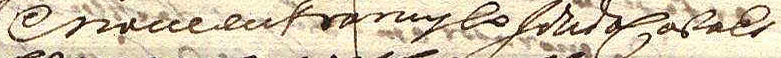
E noue eu FrancisCo Joze da Costa Es
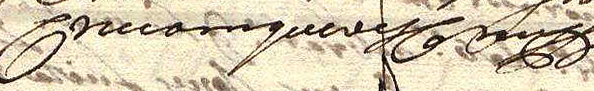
Criuam que o esCreuy
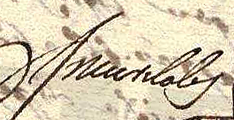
Jncurelabes
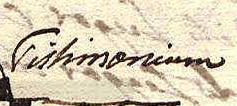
Tistimonium
